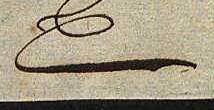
E
